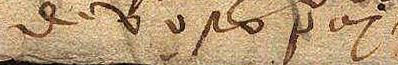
de voso pay
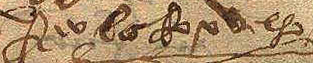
frco baRoso velho
